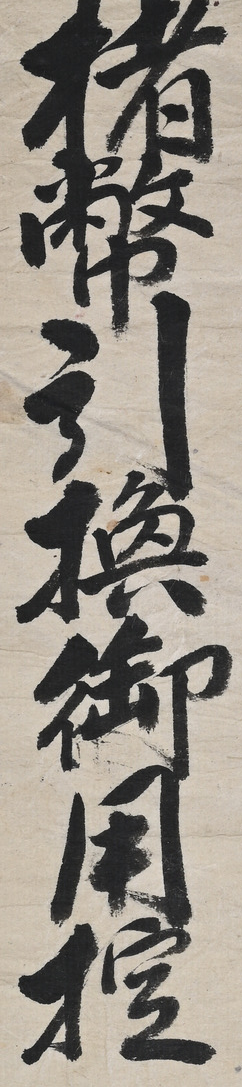楮幣引換御用控

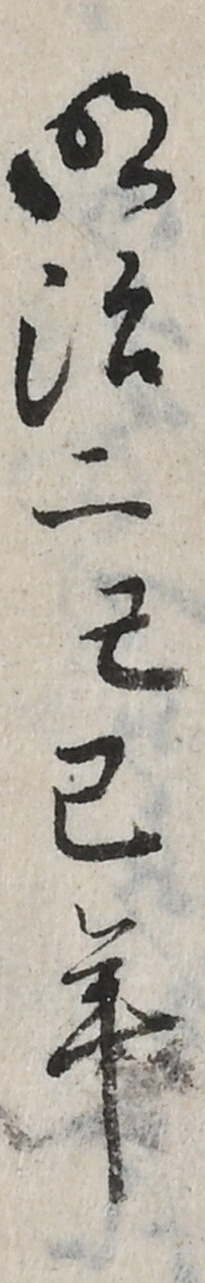明治二己巳年
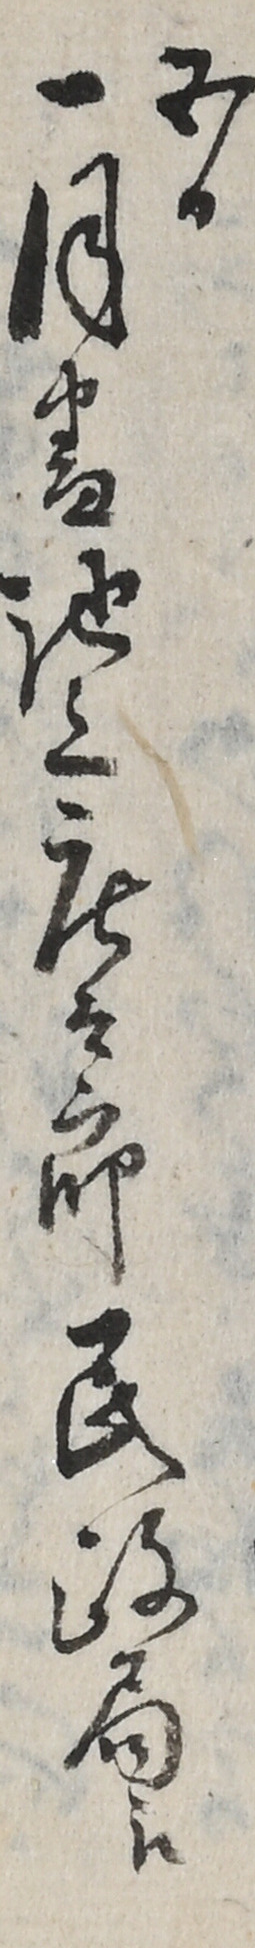一月番池上庄太郎民政局江
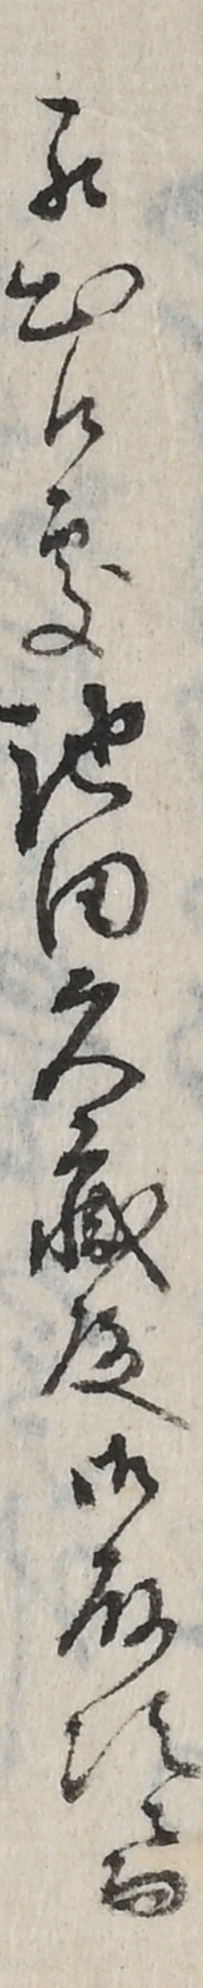罷出候処池田久蔵殿御取次ニ而
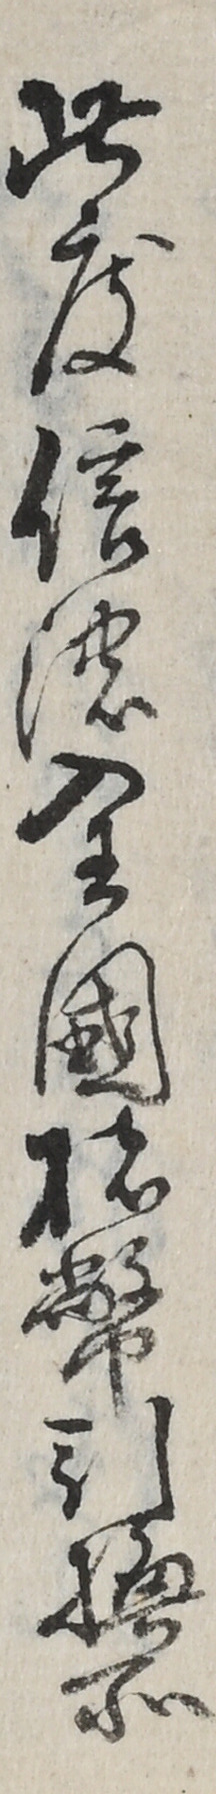此度信濃全国楮幣引換所
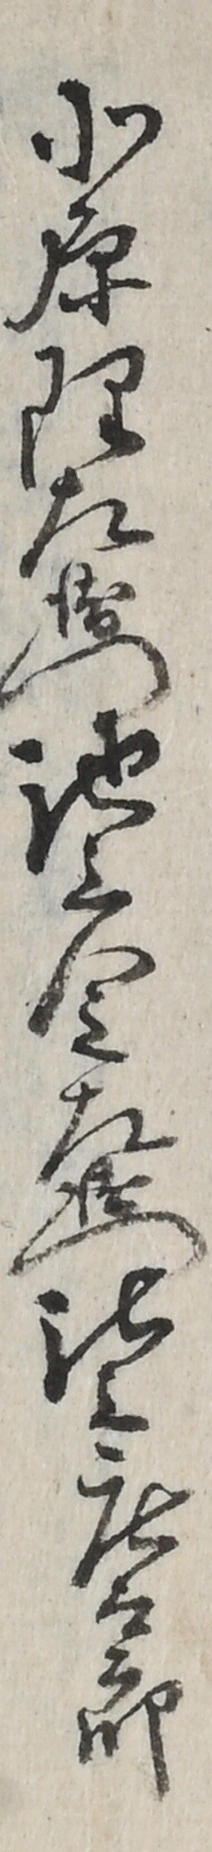北原理左衛門池上金左衛門池上庄太郎
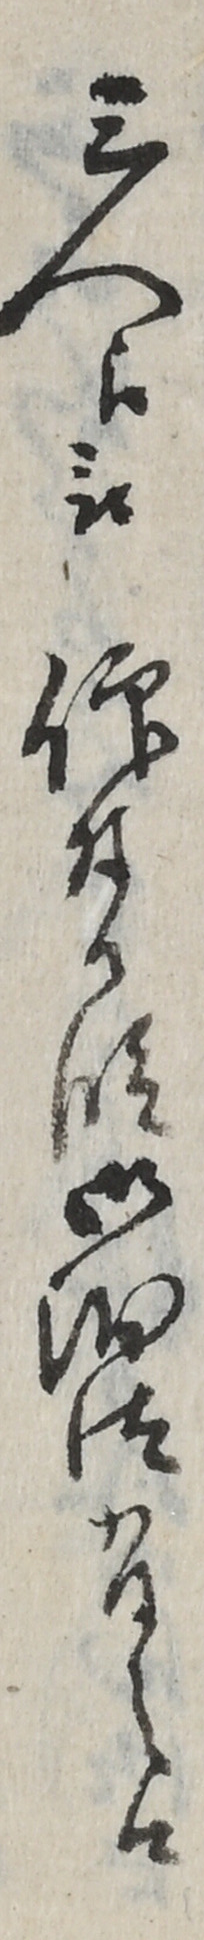三人江被仰付候段御沙汰有之候
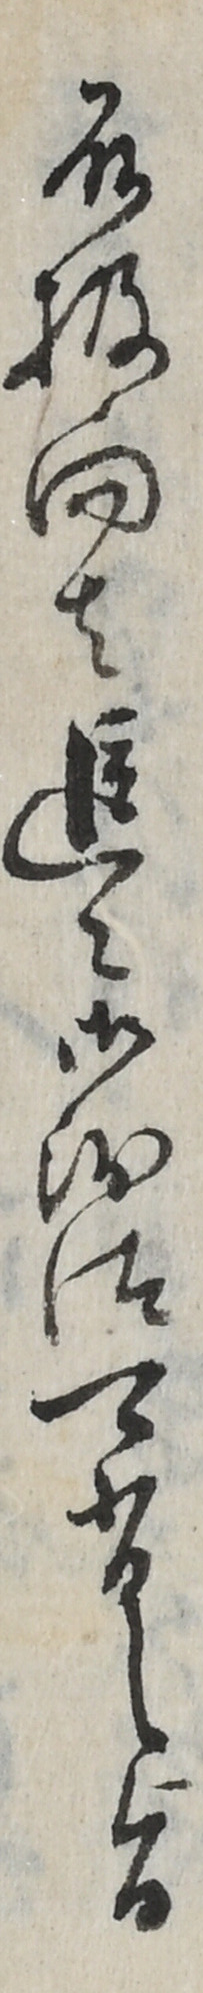取扱向は追々御沙汰可有之候旨
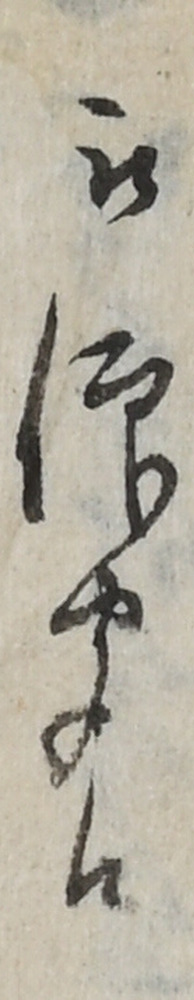被仰聞候

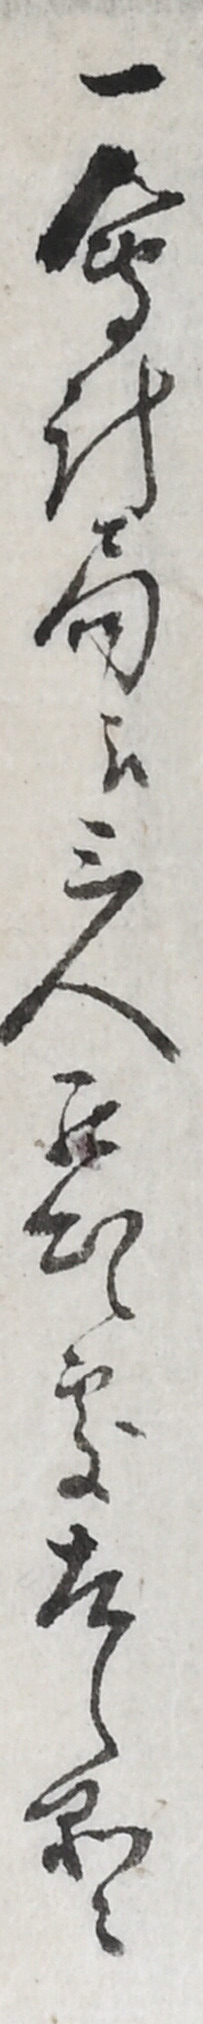一会計局江三人罷出候処左之品々
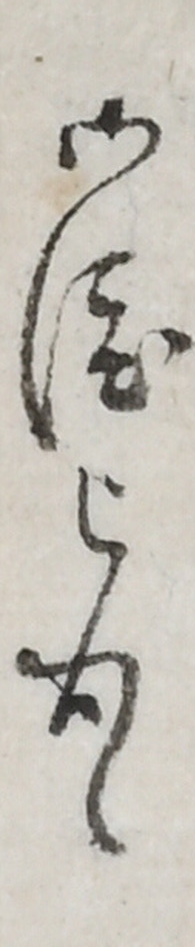御渡被成候
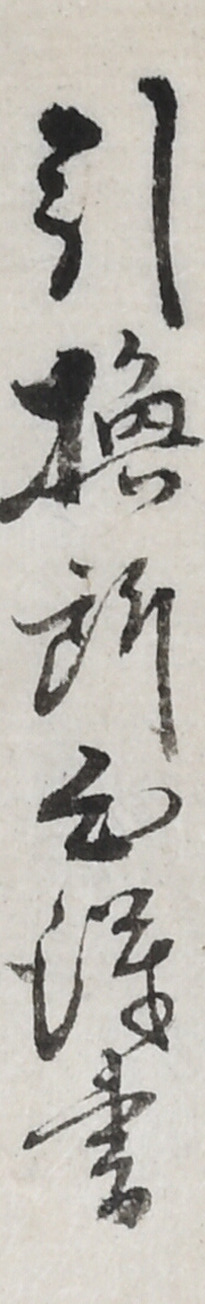引換所心得書
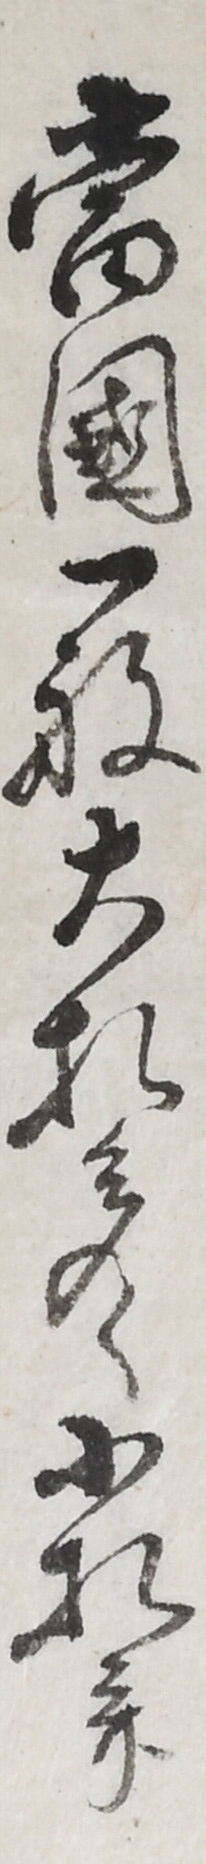当国一般大札多く小札并
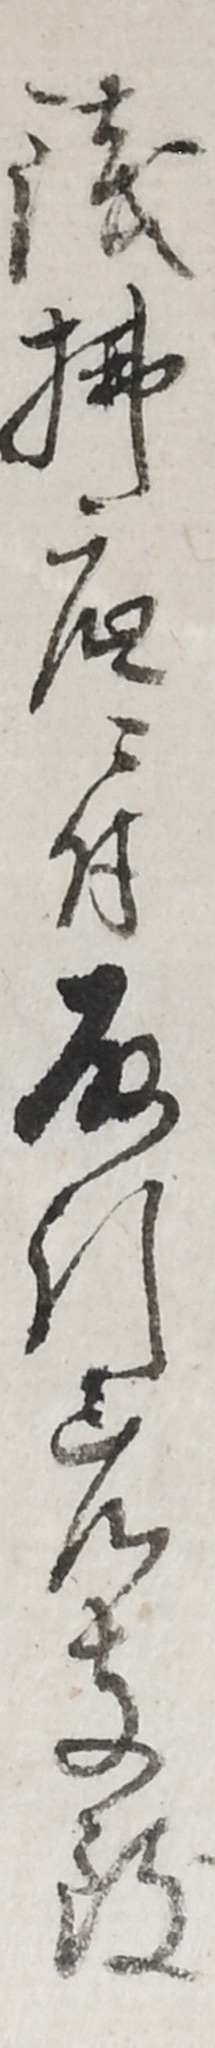銭払底ニ付取引差支致
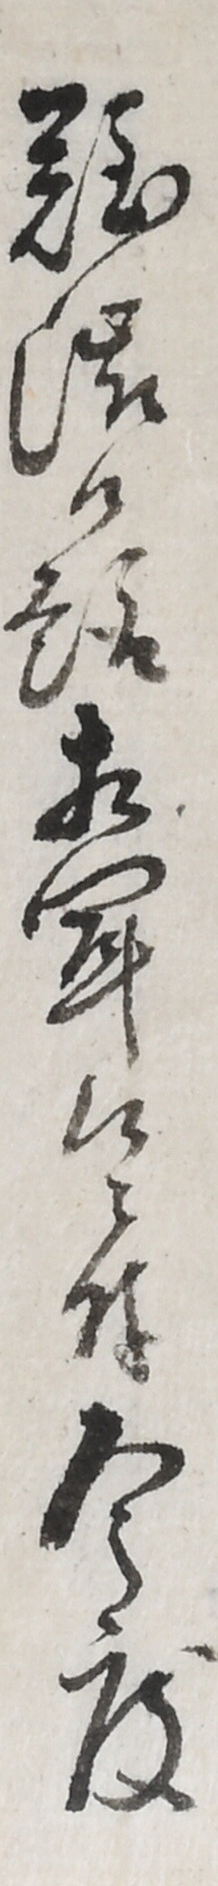難渋候趣相聞候ニ付今度
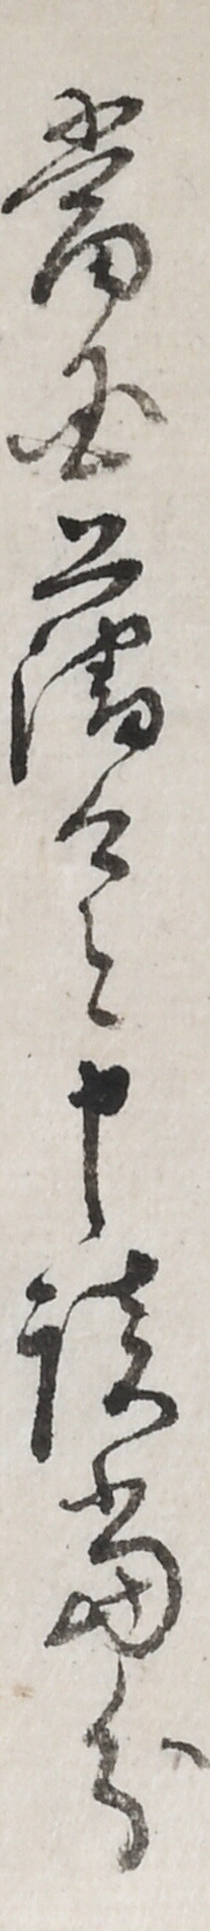当国藩公と申談当分
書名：信濃全國楮幣引換御用控
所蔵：伊那市立高遠町図書館・合同会社AMANE
